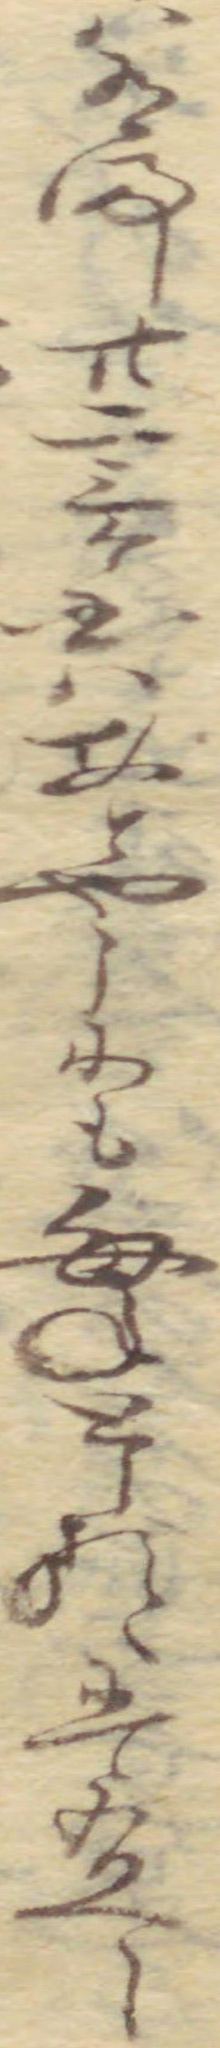は有まし廿二三ケ国はなとやうにも毎年とらるゝにて有へし
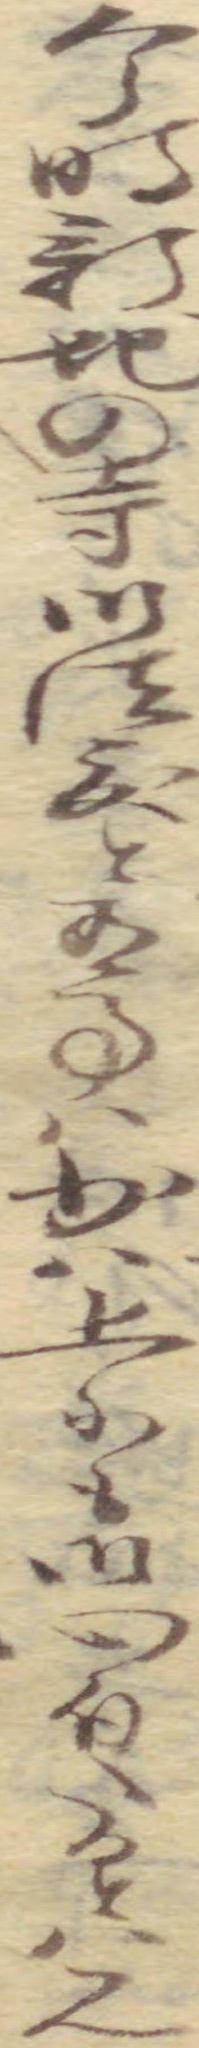今時新地の寺御法度と有事は少は上にも御心付たるとは見
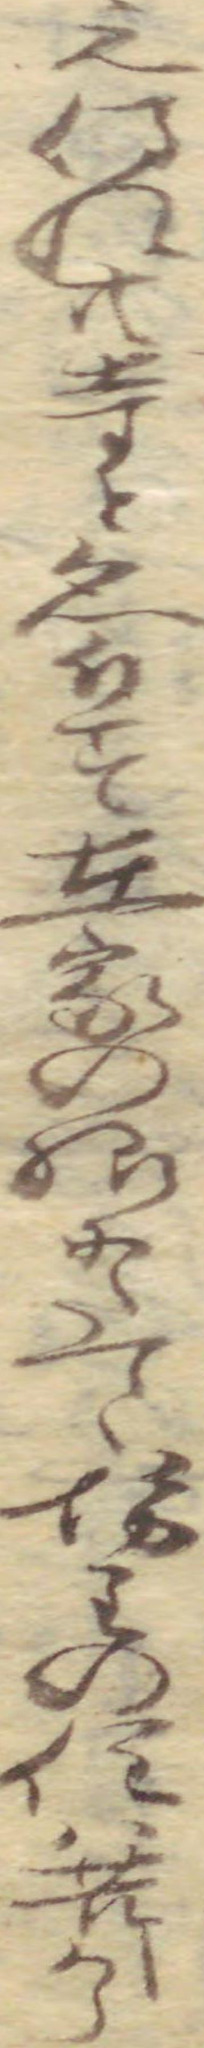え侍れ共寺と名付す在家の様にたてゝ坊主の住は苦しから
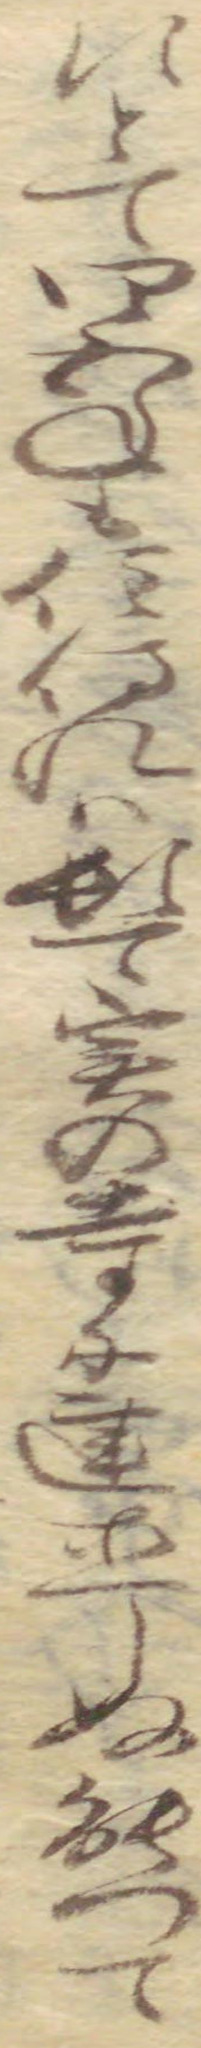すとて四五年も住侍れは頓て実の寺に建直しぬ能つて
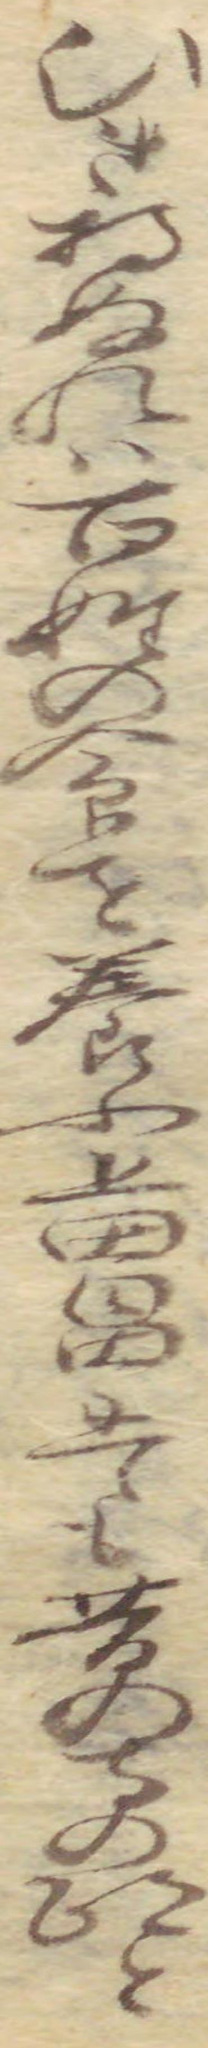ひき持ぬれは百姓の命を養ふ上田畠にても昔の寺の跡と
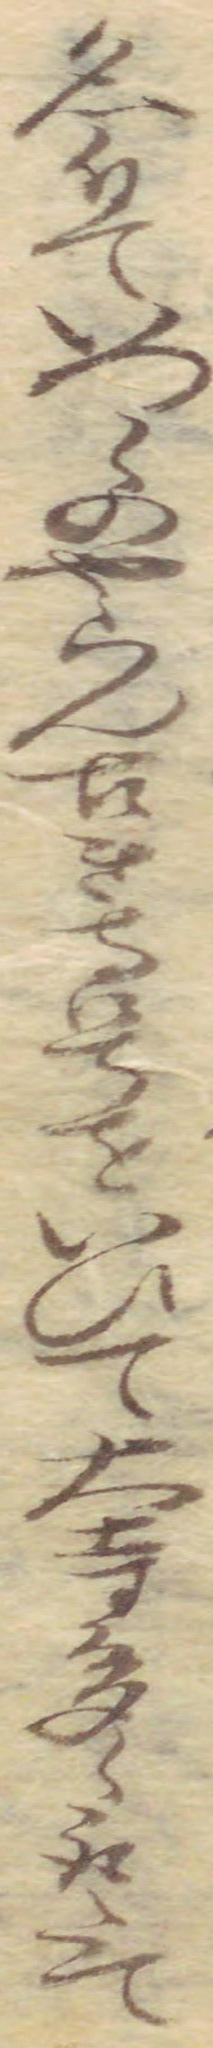名付ていつくのやらん古き寺号をいひて大寺多く取たて
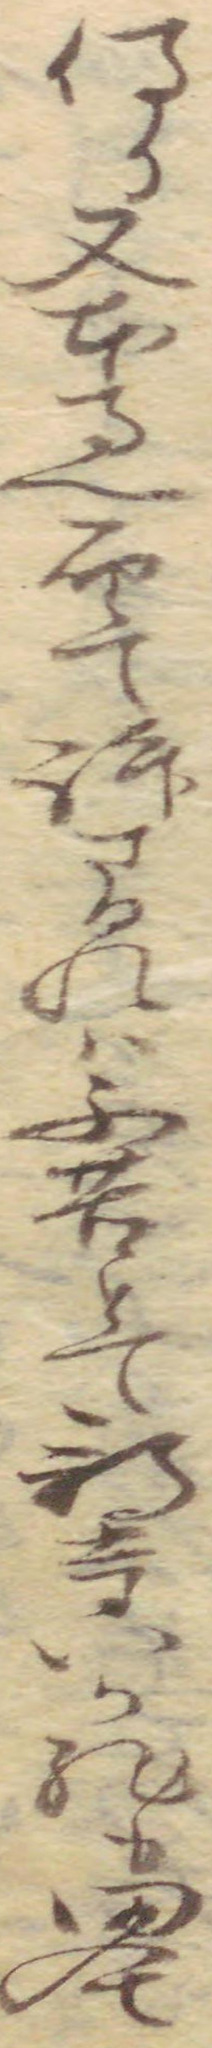侍り又本寺へ届て許さるれは不苦とて新寺いか程も田舎
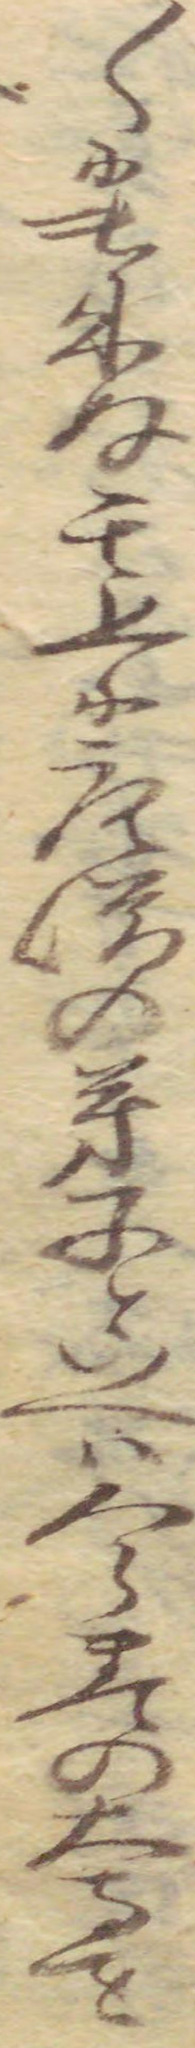〳〵に出来ぬ其上に唐僧の弟子といへは今まての大寺を
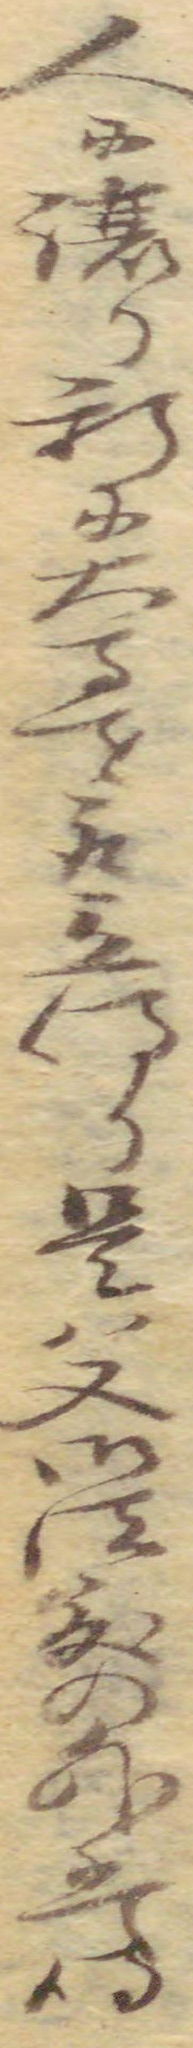人に譲り新に大寺を取立侍り是は又御法度の外にて侍

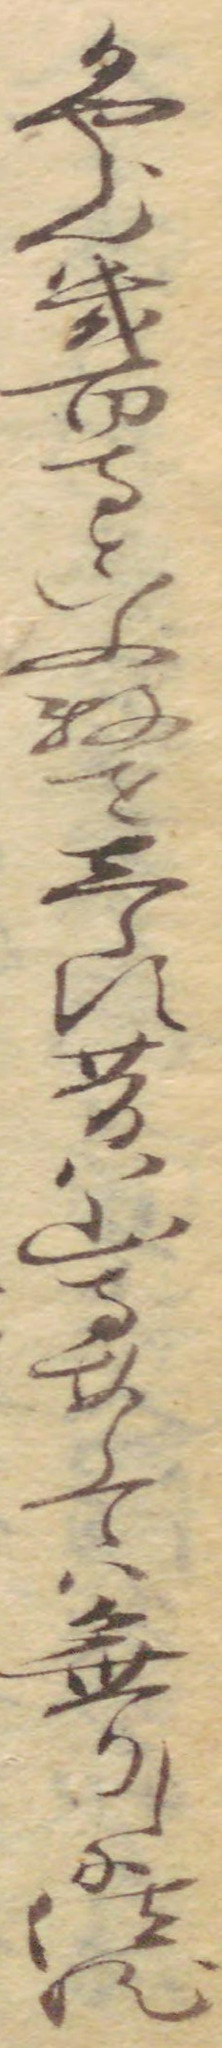るやらん幾百寺といふ数をしらす昔は山寺ならては無りしに法然
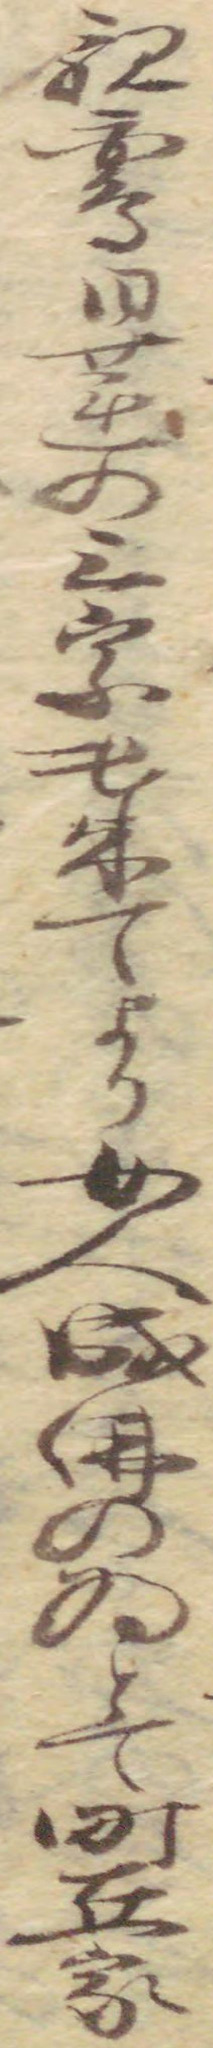親鸞日蓮の三宗出来てより女人成仏の為とて町在家
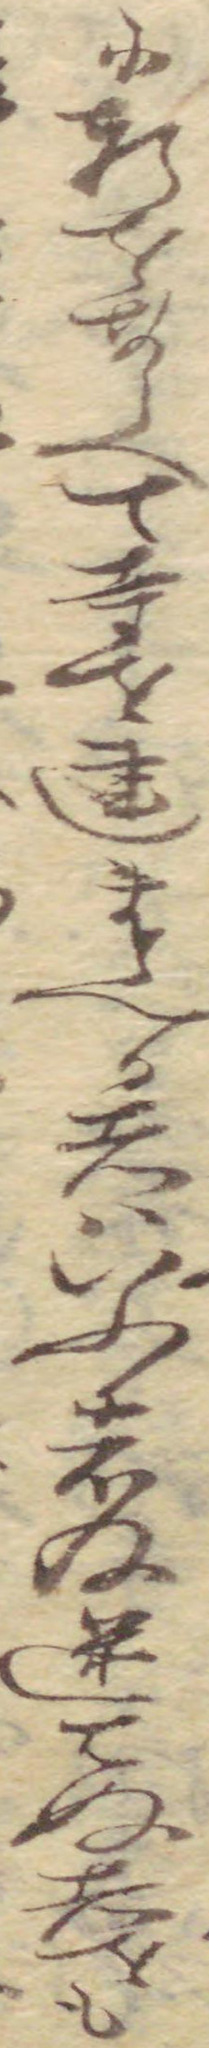に軒をならへて寺を建まとへる者はいふに不及迷はぬ者をも
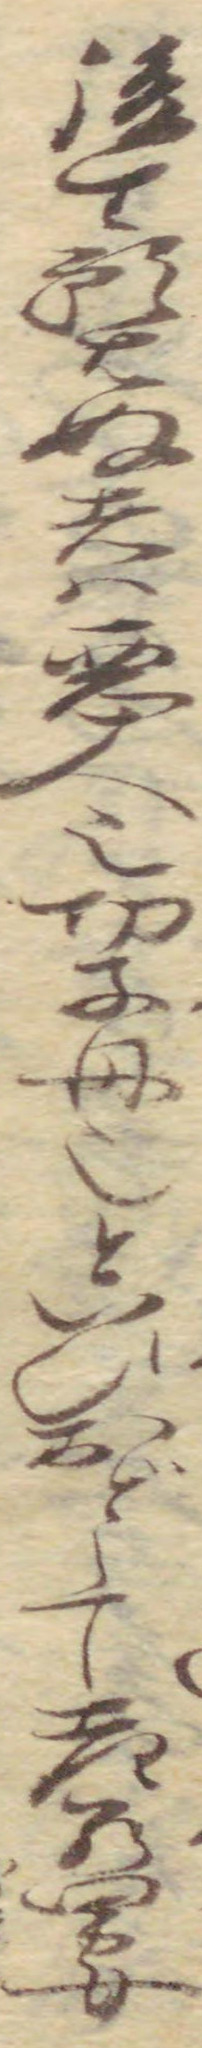後生願はぬ者は悪人也切支丹也といひおどして老若男女
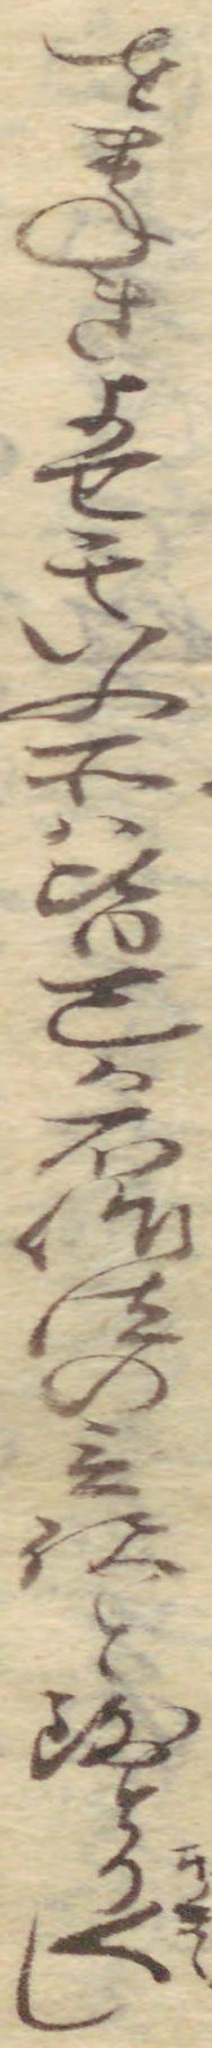をまねきよせ其いふ所は皆己か不作法の言訳と銭とりくし
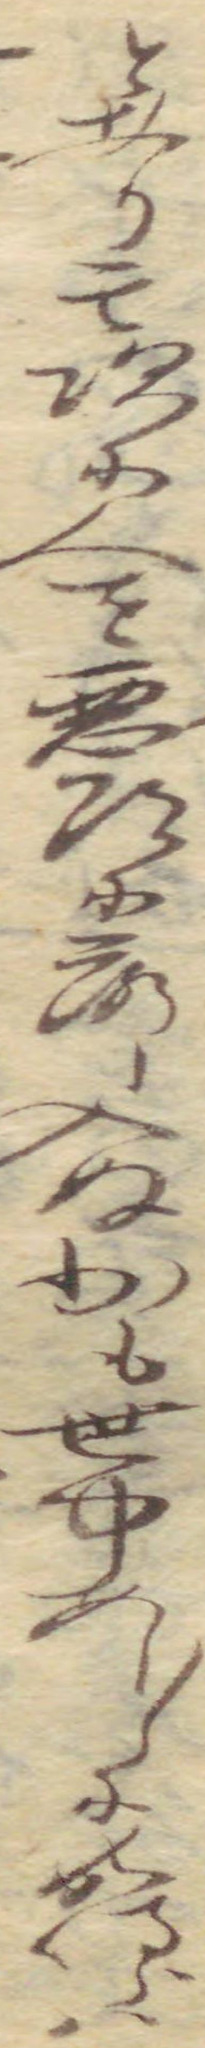となり其次に人を悪道に落し入ぬ少も世中あしくに成侍らは
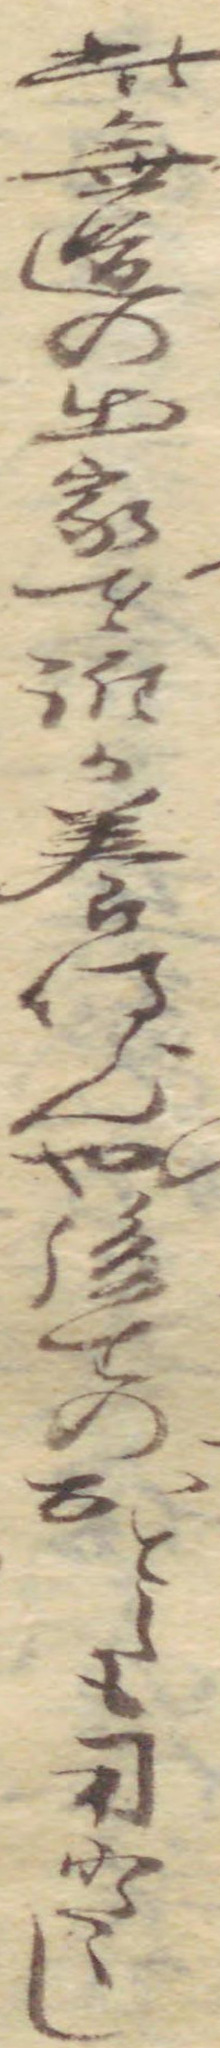此無道の出家を誰か養侍らんや後生のおとしも用にたゝし
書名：鶯宿雑記. 巻263-264
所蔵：国立国会図書館 National Diet Library, JAPAN
